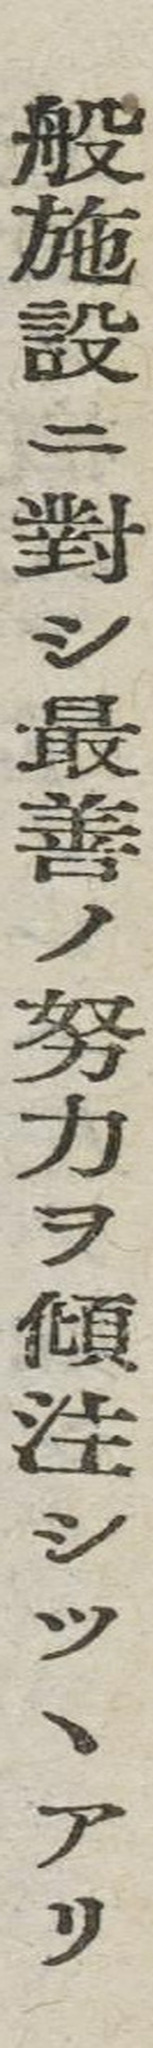般施設ニ対シ最善ノ努力ヲ傾注シツヽアリ
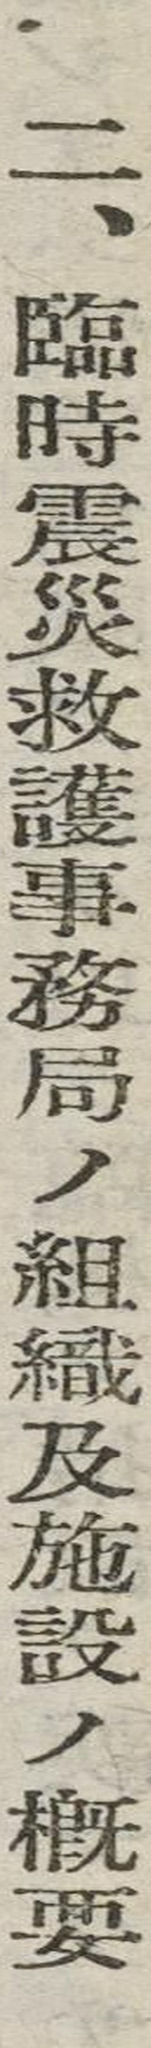ニ、臨時震災救護事務局ノ組織及施設ノ概要
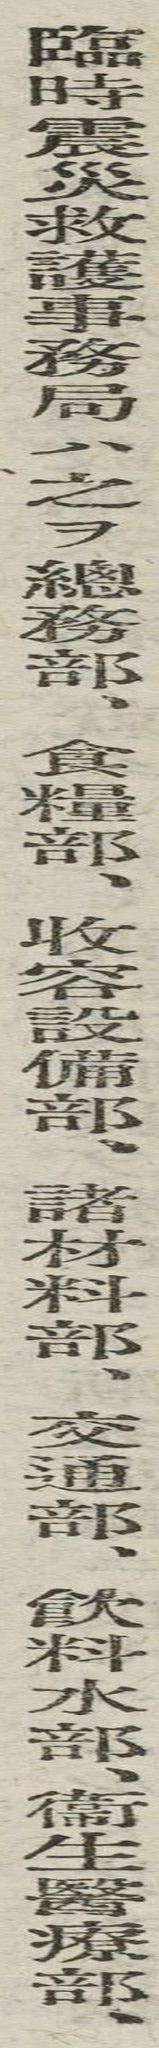臨時震災救護事務局ハ之ヲ総務部、食糧部、収容施設部、緒材料部、交通部、飲料水部、衛生医療部、
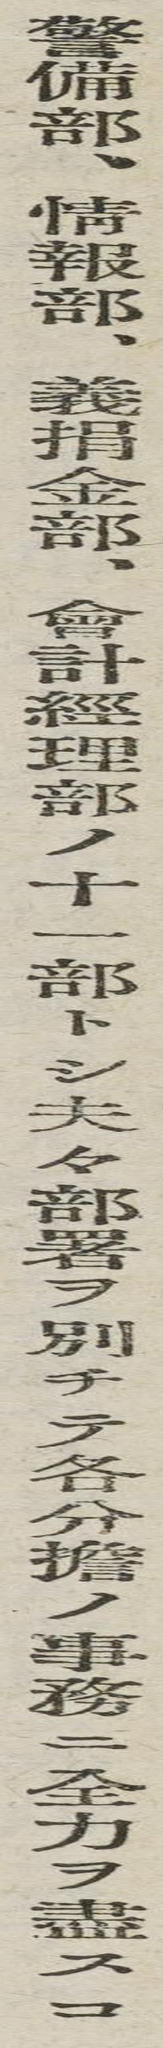警備部、情報部、義捐金部、会計経理部ノ十一部トシ夫々部署ヲ別チテ各分担ノ事務ニ全力ヲ尽スコ
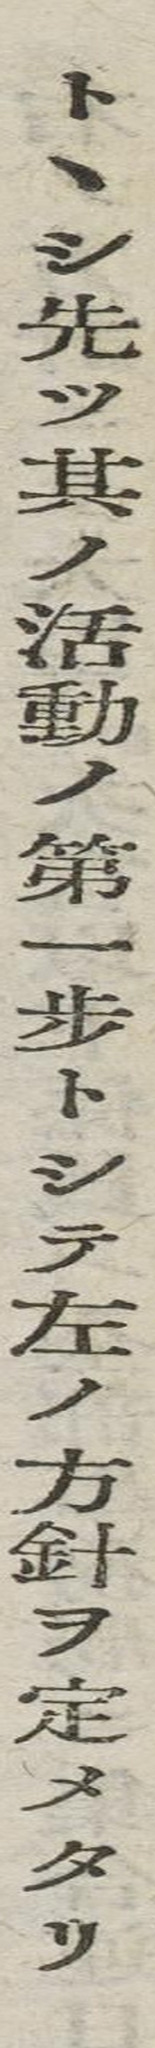トヽシ先ツ其ノ活動ノ第一歩トシテ左ノ方針ヲ定メタリ
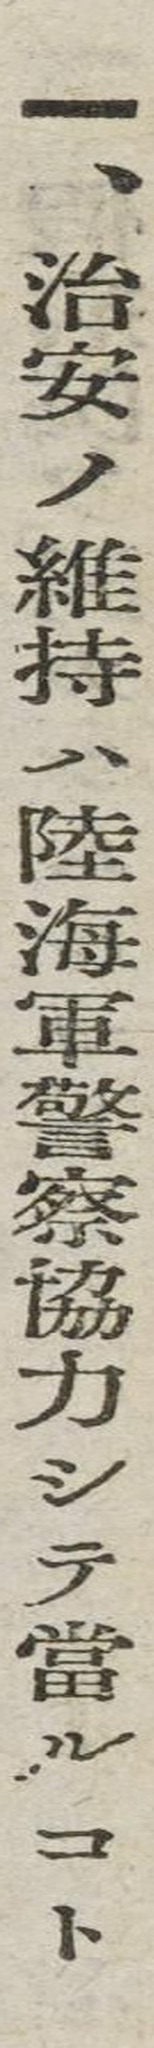一、治安ノ維持ハ陸海軍警察協力シテ当ルコト
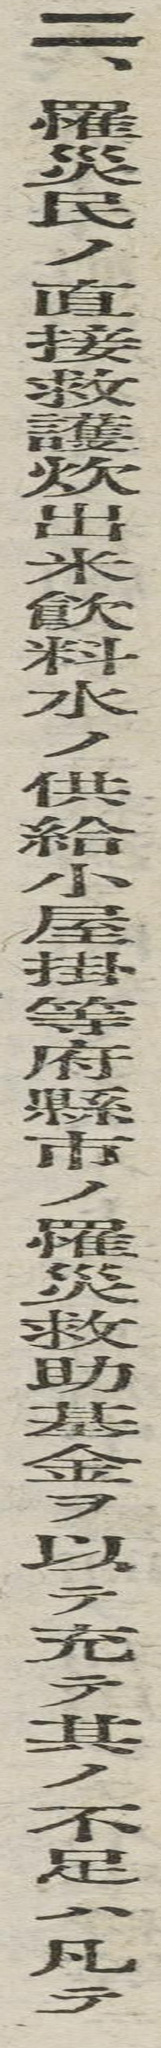ニ、罹災民ノ直接救護炊出米飲料水ノ供給小屋掛等府県市ノ罹災救助基金ヲ以テ充テ其ノ不足ハ凡テ
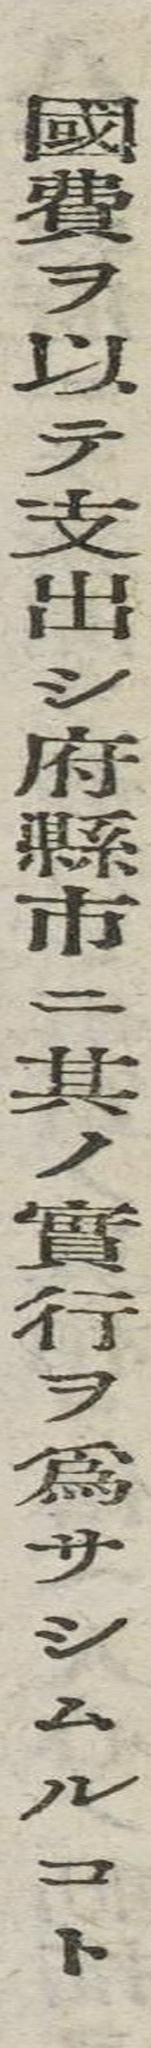国費ヲ以テ支出シ府県市ニ其ノ実行ヲ為サシムルコト
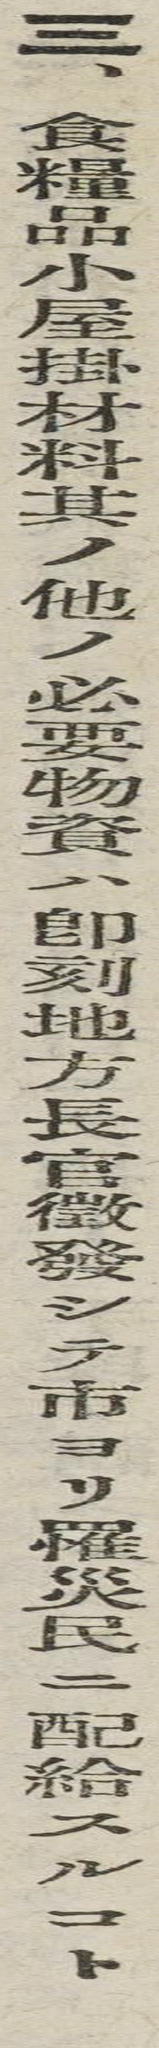三、食料品小屋掛材料其ノ他ノ必要物資ハ即刻地方長官徴発シテ市ヨリ罹災民ニ配給スルコト
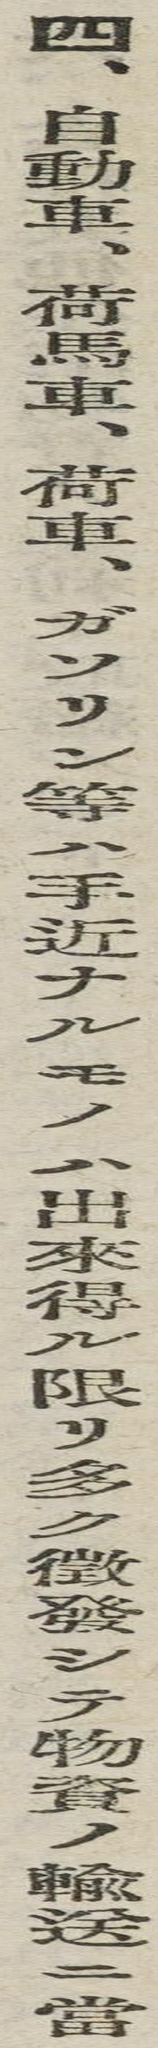四、自動車、荷馬車、荷車、ガソリン等ハ手近ナルモノハ出来得ル限リ多ク徴発シテ物資ノ輸送ニ当
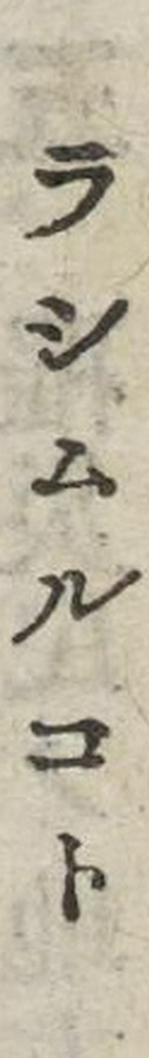ラシムルコト

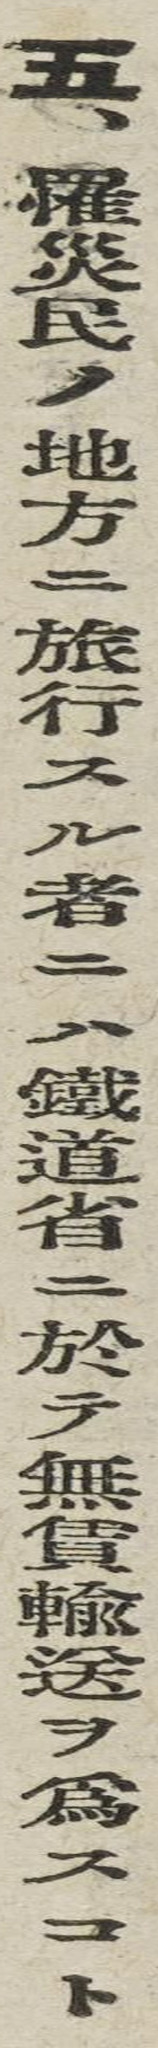五、罹災民ノ地方ニ旅行スル者ニハ鉄道省ニ於テ無賃輸送ヲ為スコト
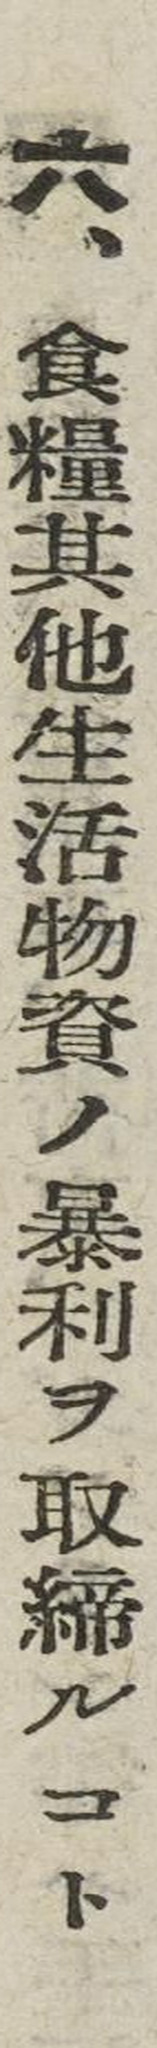六、食糧其他生活物資ノ暴利ヲ取締ルコト
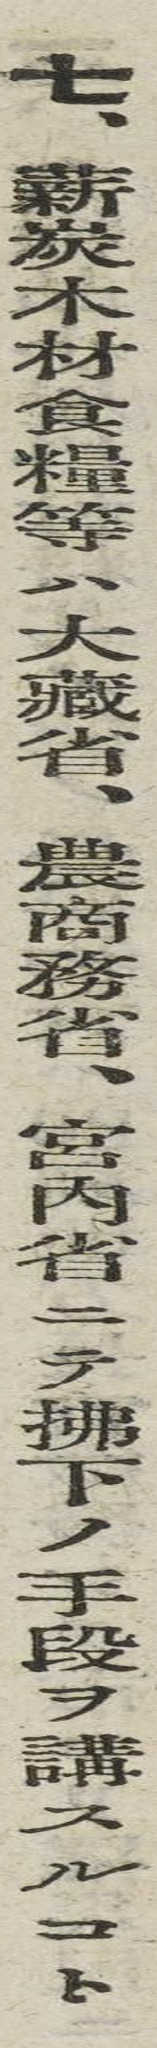七、薪炭木材食糧等ハ大蔵省、農商務省、宮内省ニテ払下ノ手段ヲ講スルコト
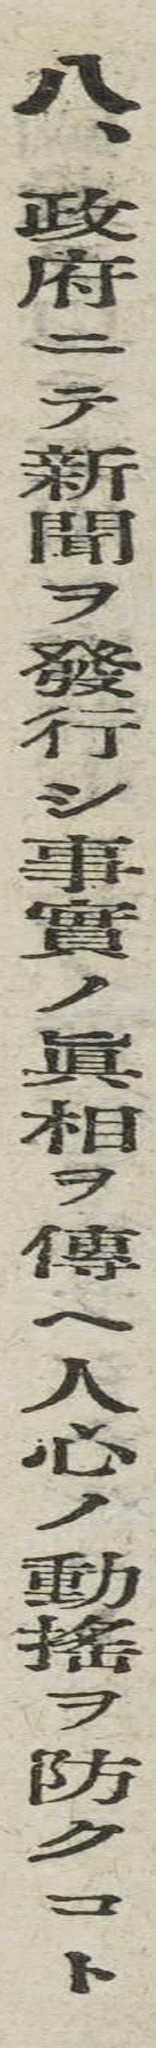八、政府ニテ新聞ヲ発行シ事実ノ真相ヲ伝ヘ人心ノ動揺ヲ防クコト
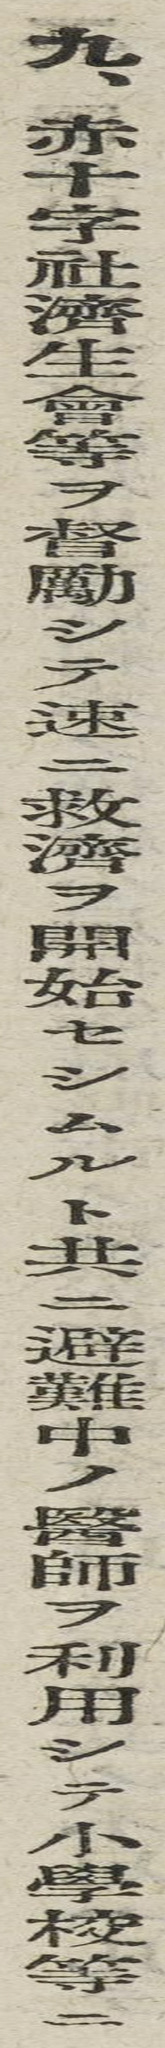九、赤十字社済生会等ヲ督励シテ速ニ救済ヲ開始セシムルト共ニ避難中ノ医師ヲ利用シテ小学校等ニ
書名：震災被害状況並救護施設概要
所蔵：東京大学地震研究所図書室 Earthquake Research Institute Library, The University of Tokyo, JAPAN
